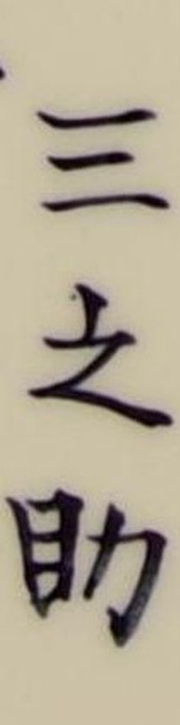三之助
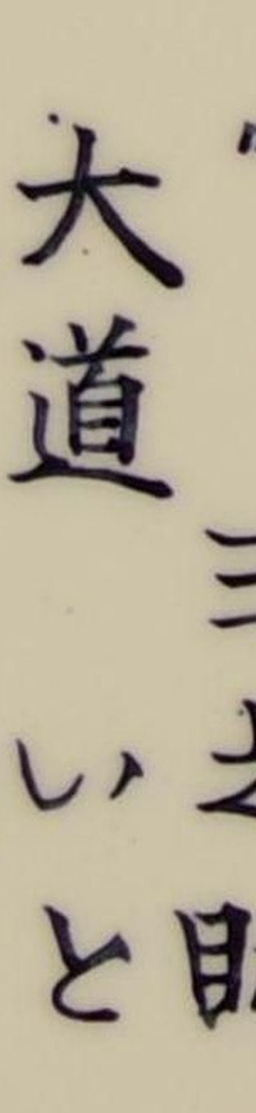大道いと
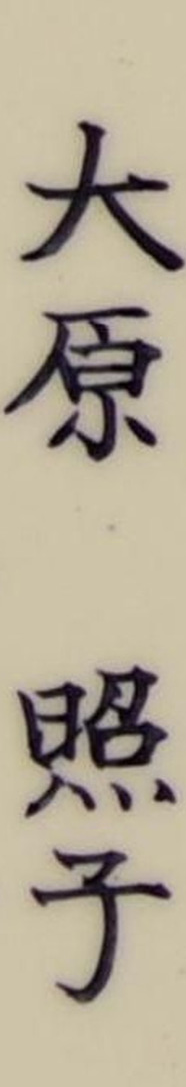大原照子
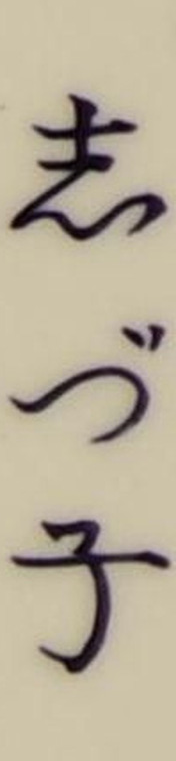しづ子
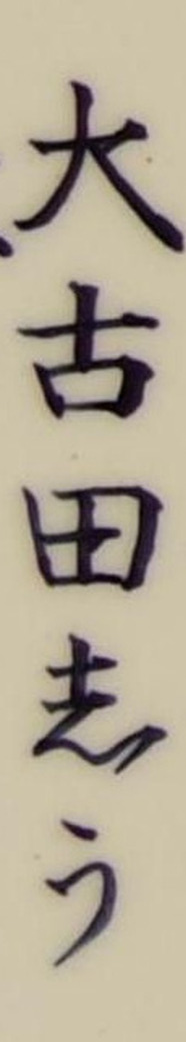大古田しう
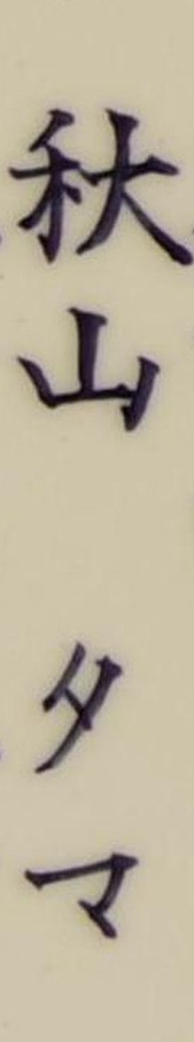秋山タマ

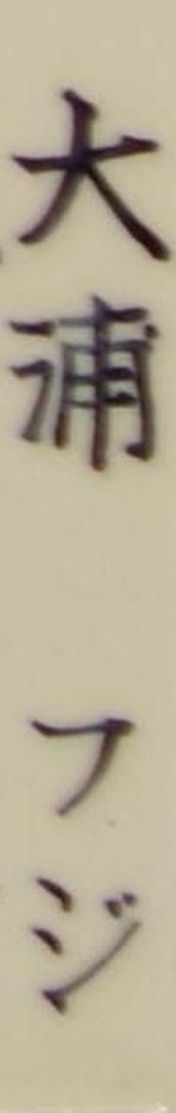大浦フジ
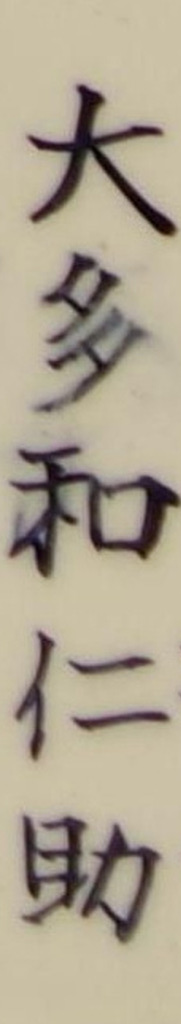大多和仁助
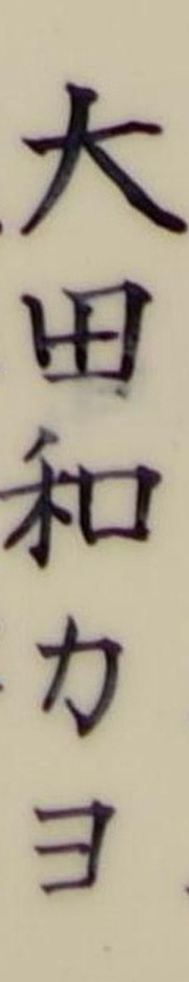大田和カヨ
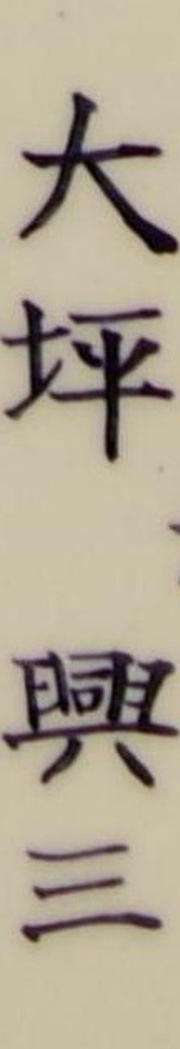大坪興三
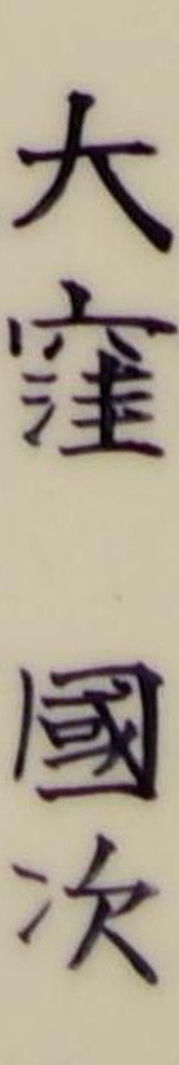大窪国次
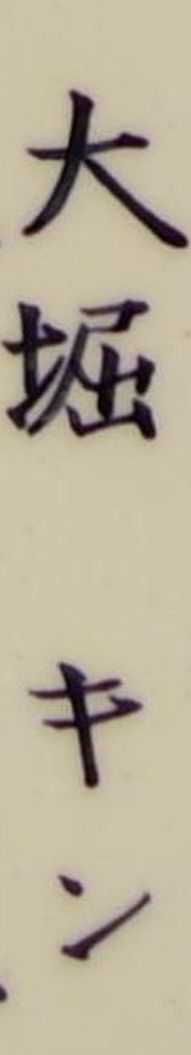大堀キン
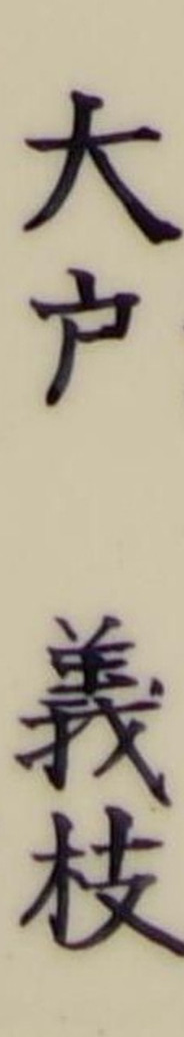大戸義枝
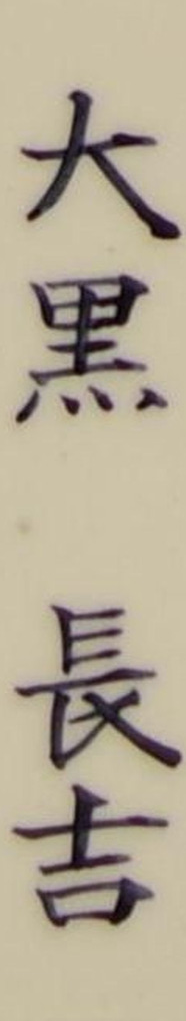大黒長吉
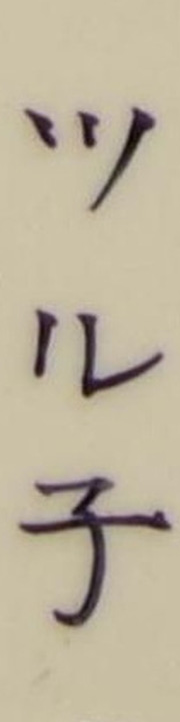ツル子
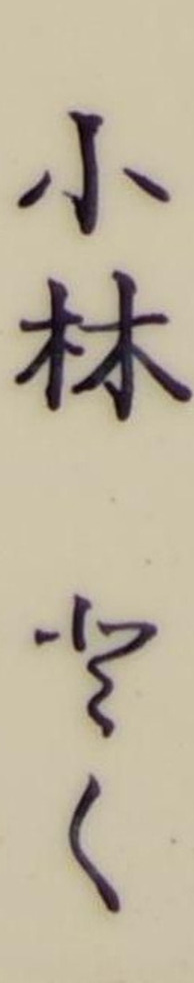小林とく
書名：A~D
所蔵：koyasan kongobuji
